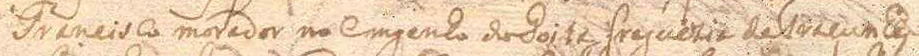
Francisco morador no emgenho do Poita, freguezia de Tracunha
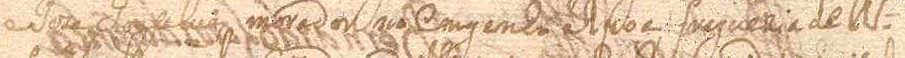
e Ioze Iouce luiz morador no Emgenho Apoa freguezia de N.
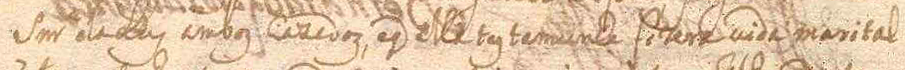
Snr da Lus amboz Cazados, e q̄ ella testemunha fizera uida marital
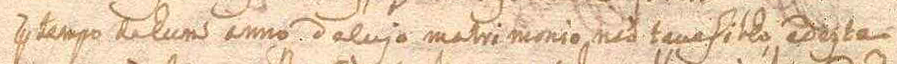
p̄ tempo de hum anno de cujo matrimonio naõ teue filho, e deste
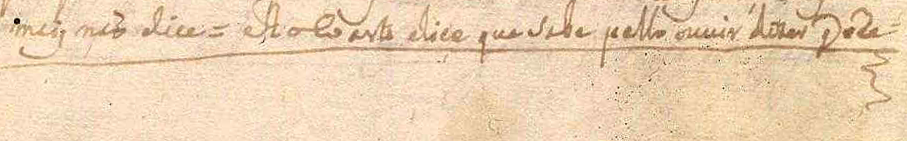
mais naõ dice- Ao Coarto dice que sabe pello ouuir dizar q̄ o Re
